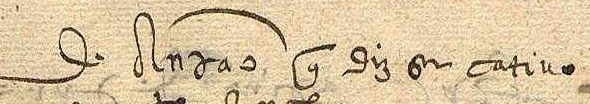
de Antão q̄ diz ser catiuo
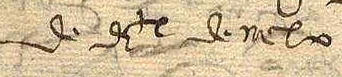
de drte de melo
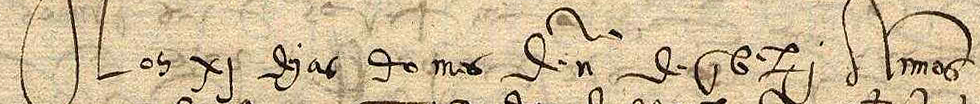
Aos xj dias do mes de nro de j̄bcLj Annos
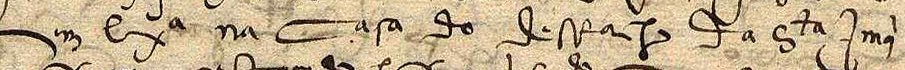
em lxa na Casa do despacho da Sta Jmqi
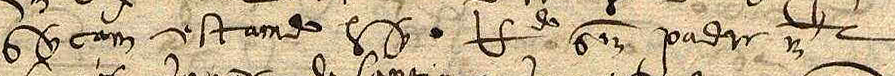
syçam estamdo hy o Rdo s̄or padre mte
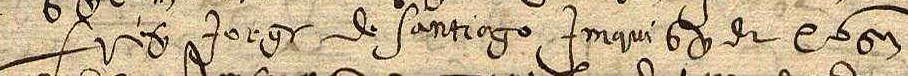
frey Jorge de Santiago Jmquisydor e o s̄or
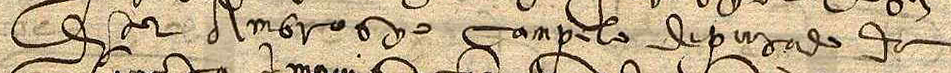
dtor Ambrosyo campelo deputado da
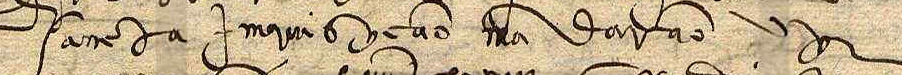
Sancta Jmquisyção mādarão vyr
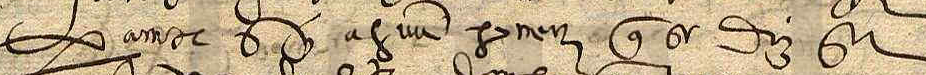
ꝑamte sy a hūu homem q̄ se diz ser
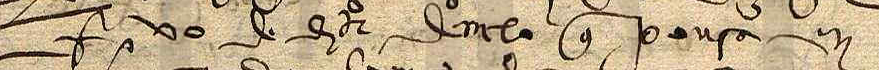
esp̄vo de drte de melo q̄ pousa em
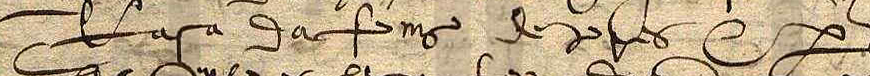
Casa dafomso de tores e ꝑ
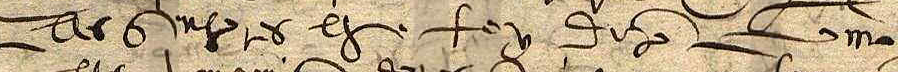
elles senhores lhe foy dit̄o Como
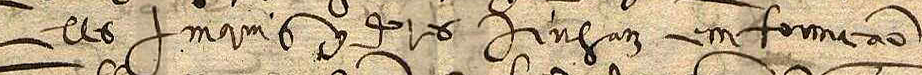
elles Jmquisydores tinham emformação
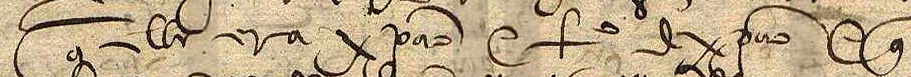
q̄ elle era xpão e fo de xpão e q̄
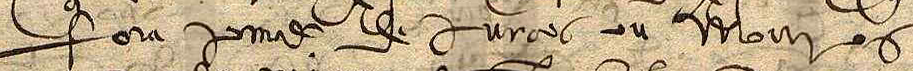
fora tomado de turcos ou mouros
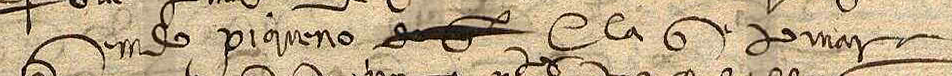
semdo piqueno do q̄L e la se tornara
